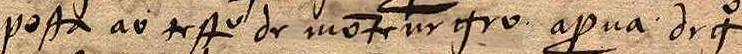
posta ao testo de mōtenegro. a ꝓua de go
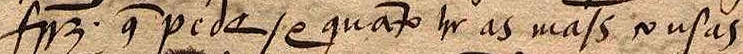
frr̄z. q̄ pede / e quāto he as maJs cousas
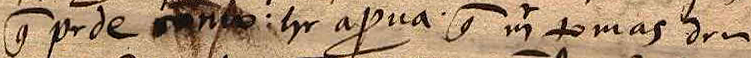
q̄ pede canto: he a ꝓua. q̄ me tomas deu
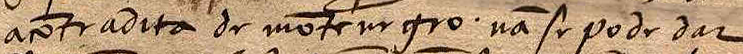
a cōtradita de mōtenegro. nā se pode dar
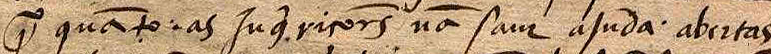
p̄oquāto as Jnq̄rições nā sam aJnda abertas
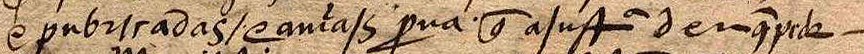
e pubrjcadas / e a maJs ꝓua. q̄ a Justa deu q̄ pede
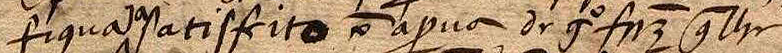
fiqua Ja satisfeito c̄o a ꝓua de go frrz̄ q̄ lhe
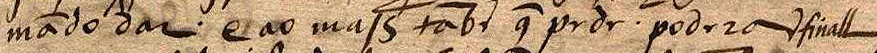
mādo dar e ao majs tābē q̄ pede. podera ē finall
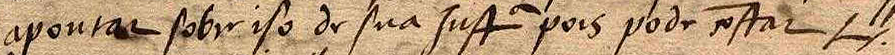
apontar sobre iso de sua Justa pois pode cōstar //.
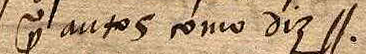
p̄o autos como diz //.
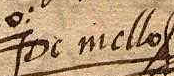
Jo de mello
